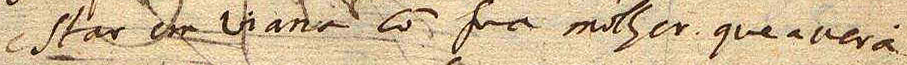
estar em viana cō sua molher que auera
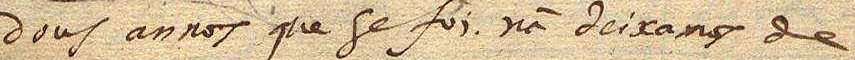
dous annos que se foi. nā deixamos de
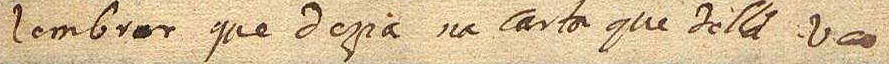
lembrar que dezia na carta que della veo
